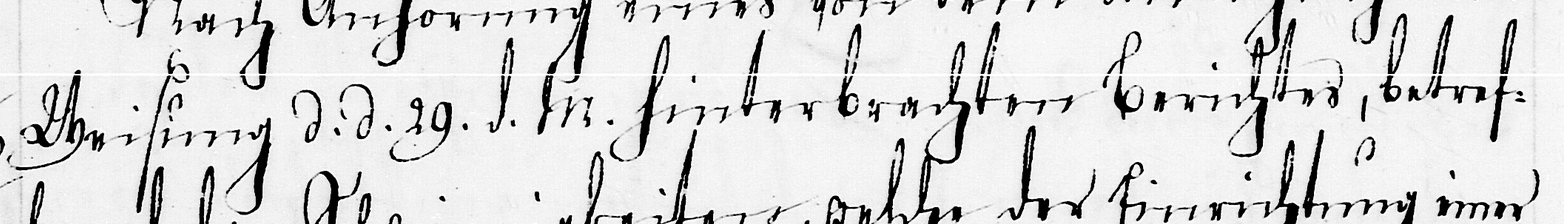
Weisung d. d. 29. d. M. hinterbrachten Berichtes, betref¬
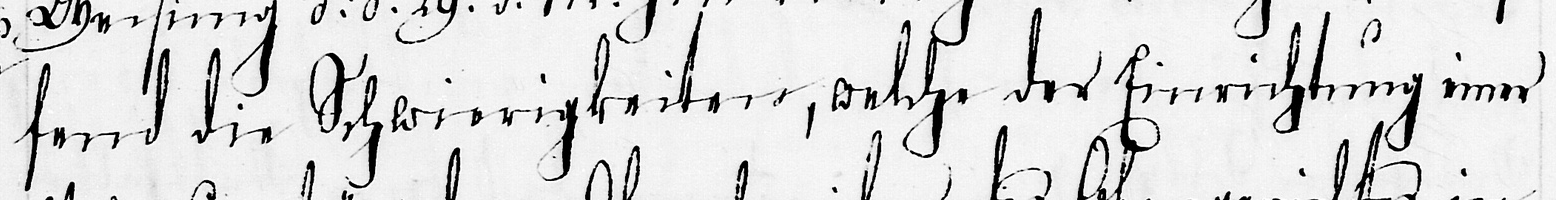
fend die Schwierigkeiten, welche der Einrichtung einer
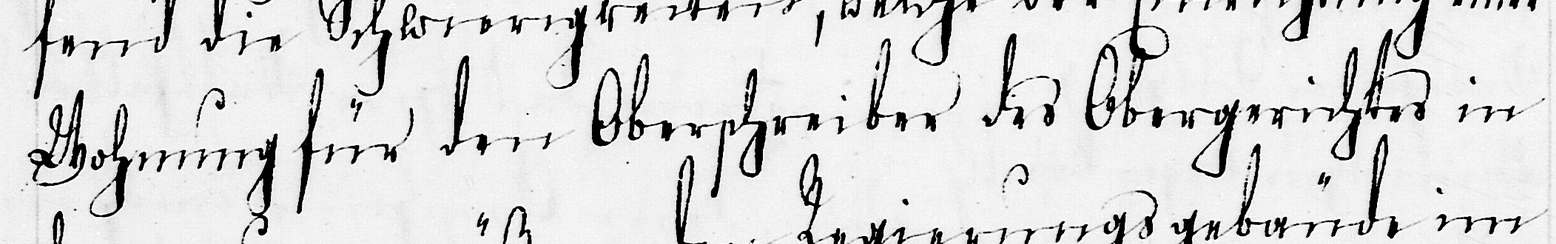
Wohnung für den Oberschreiber des Obergerichtes in
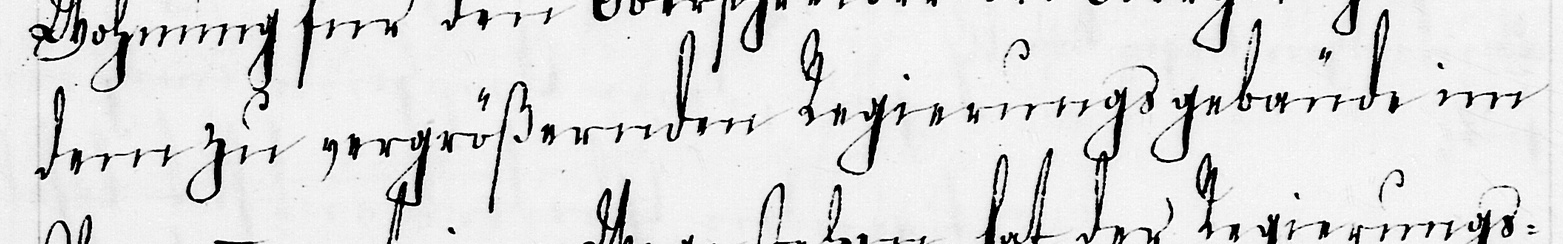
dem zu vergrößernden Regierungsgebäude im
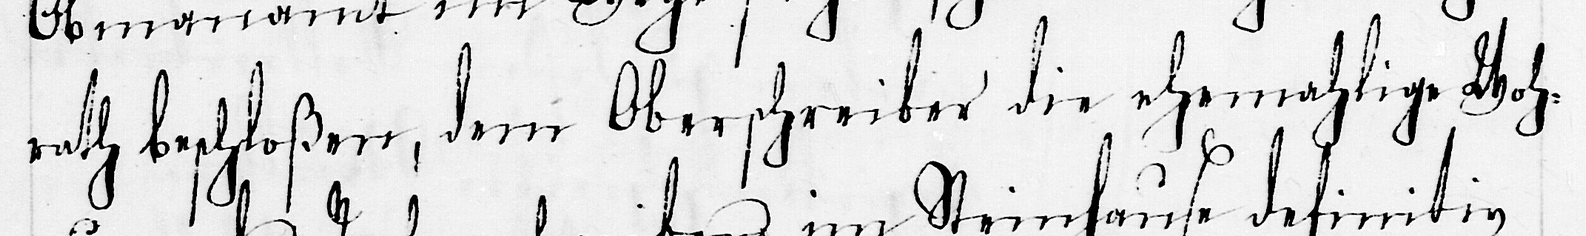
rath beschloßen, dem Oberschreiber die ehemahlige Woh¬
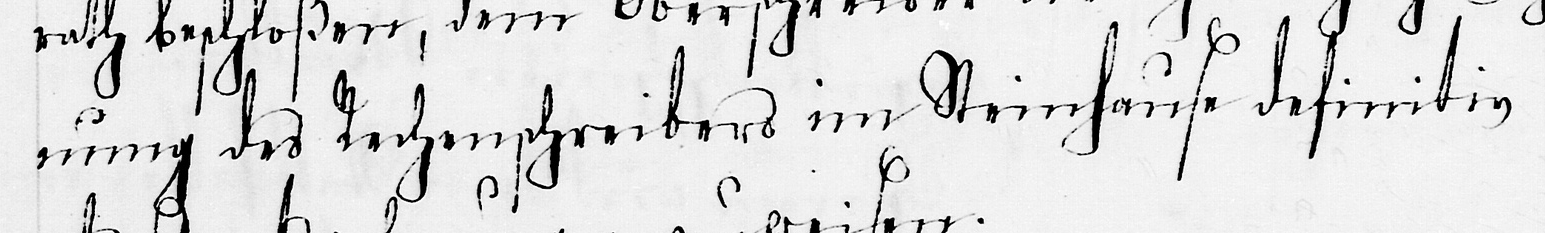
nung des Rechenschreibers im Steinhause definitiv
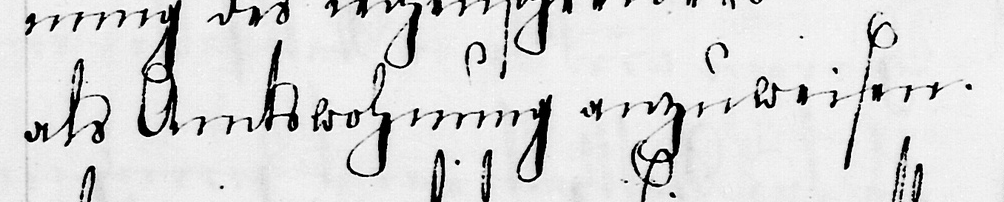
als Amtswohnung anzuweisen.
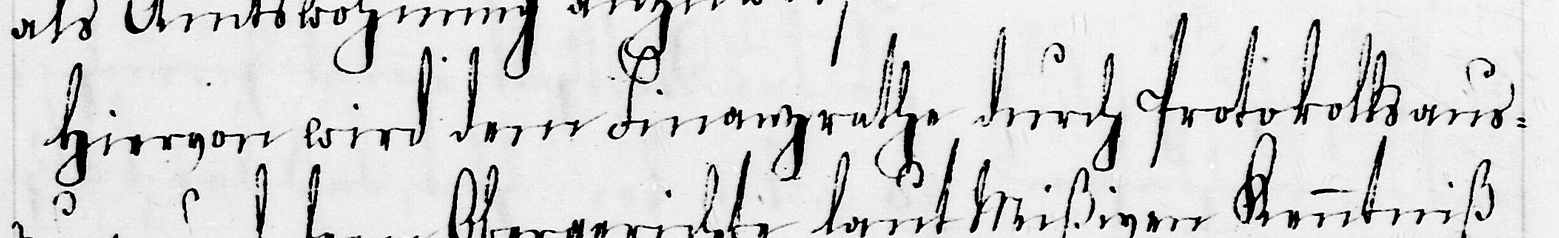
Hiervon wird dem Finanzrathe durch Protokollsaus¬
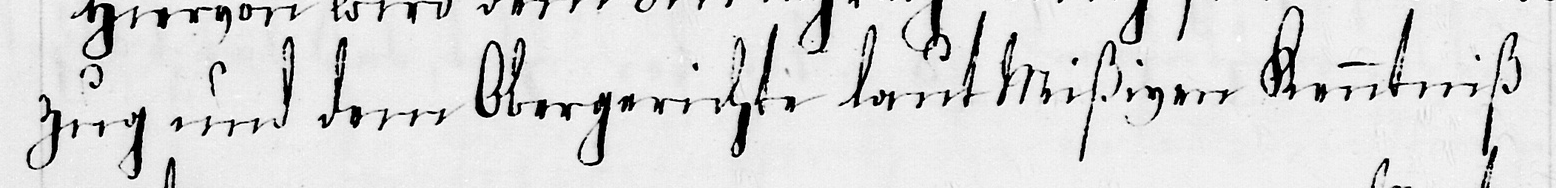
zug und dem Obergerichte laut Mißiven Kenntniß
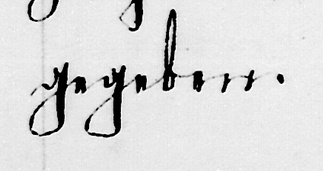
gegeben.
